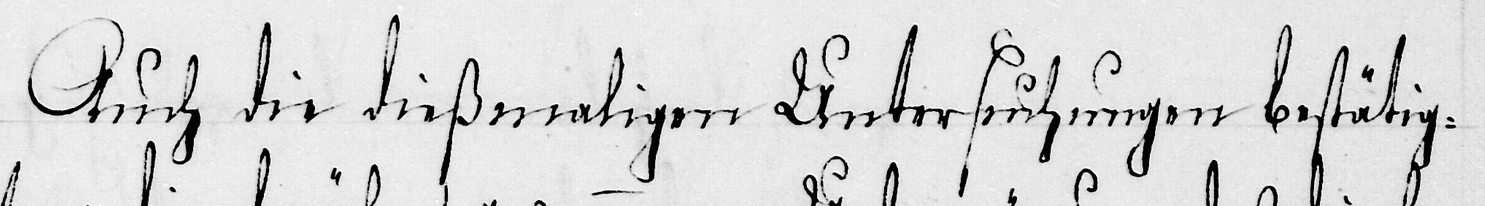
Auch die dießmaligen Untersuchungen bestätig¬
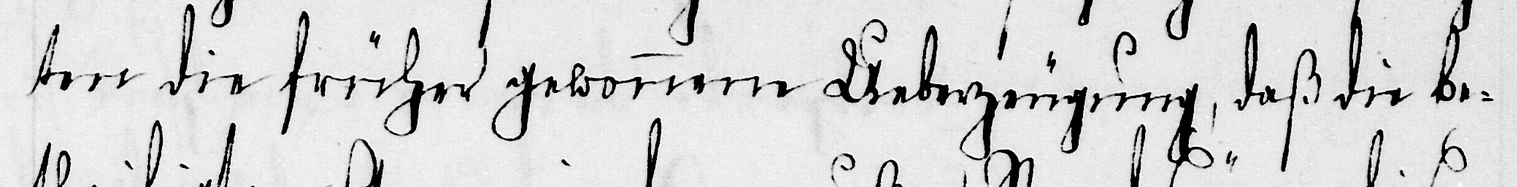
en die früher gewonnene Ueberzeugung, daß die be¬
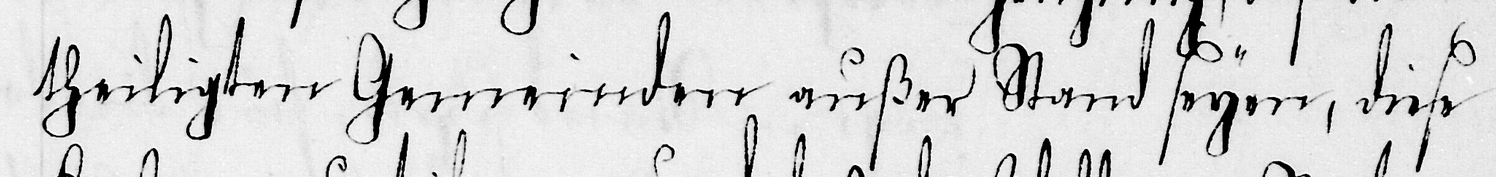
theiligten Gemeinden außer Stand seyen, diese
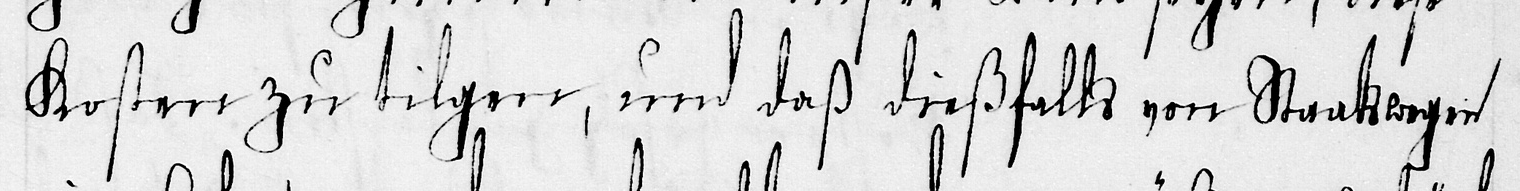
Kosten zu tilgen, und daß dießfalls von Staatswegen
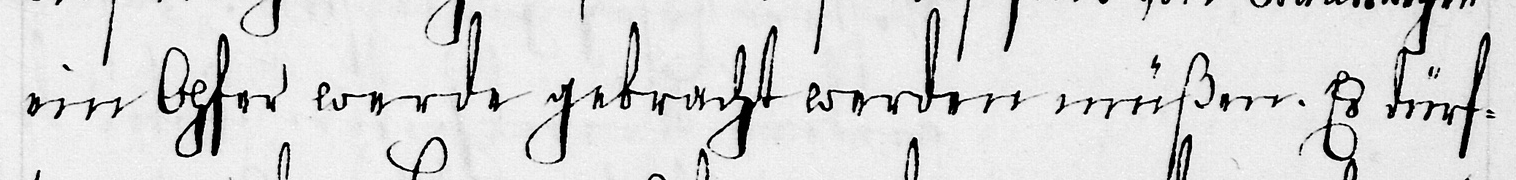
ein Opfer werde gebracht werden müßen. Es dürf¬
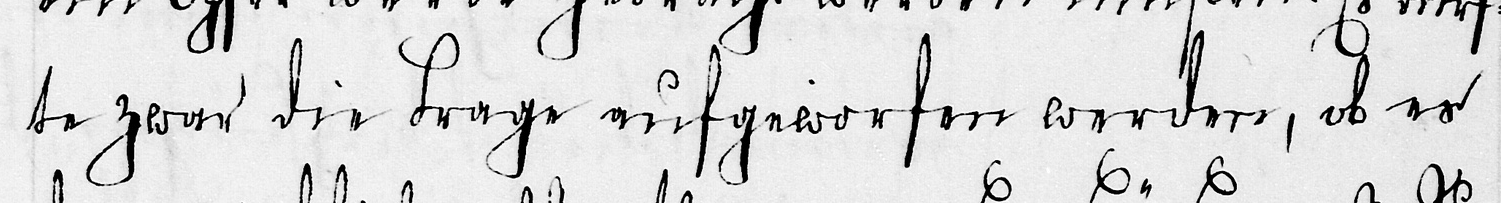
te zwar die Frage aufgeworfen werden, ob es
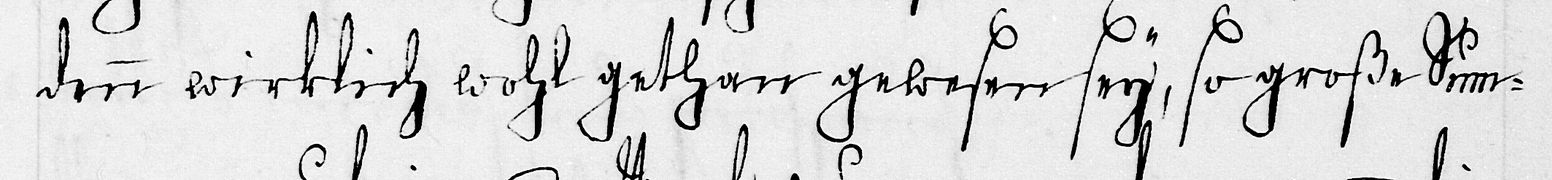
denn wirklich wohl gethan gewesen sey, so große Sum¬
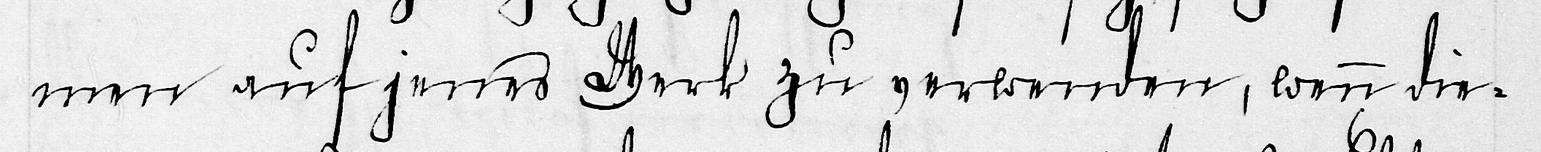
men auf jenes Werk zu verwenden, wenn die¬
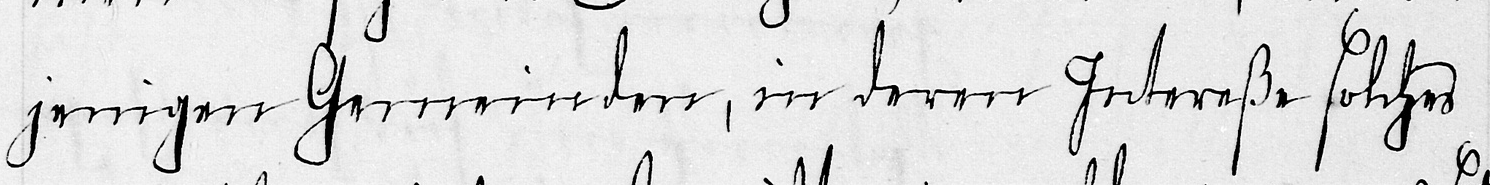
jenigen Gemeinden, in deren Intereße solches
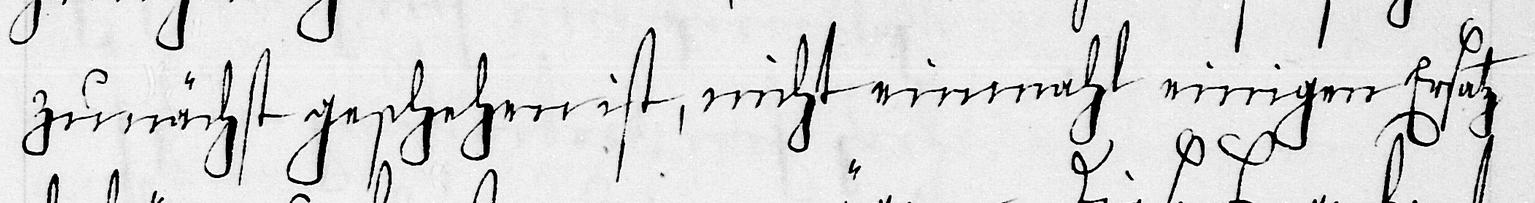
zunächst geschehen ist, nicht einmahl einigen Ersatz
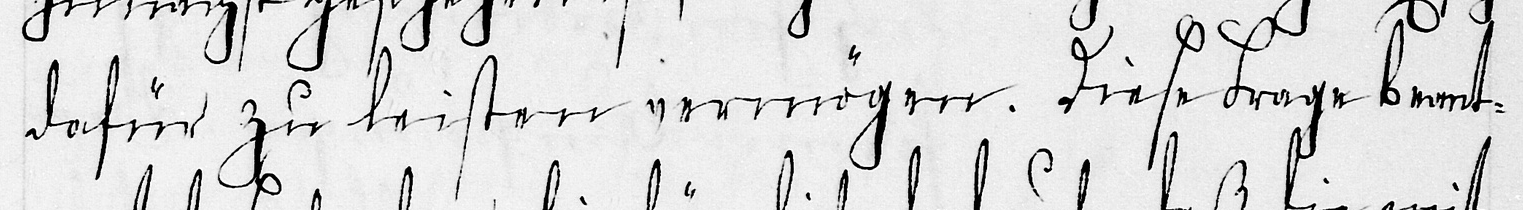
dafür zu leisten vermögen. Diese Frage beant¬
